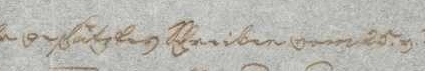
geschätztes Schreiben vom 25. v.
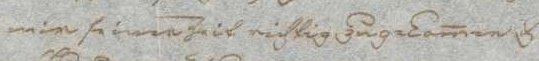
ist mir seiner Zeit richtig zugekommen &
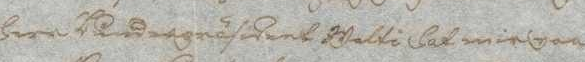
Herr Bundespräsident Welti hat mir von
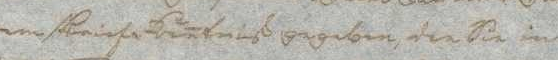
dem Briefe Kenntniß gegeben, den Sie in
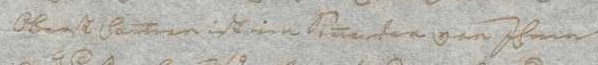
Oberst Hammer ist im Sinne der von Ihnen
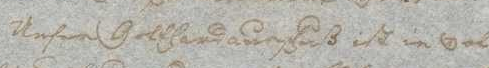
Unser Gotthardausschuß ist in vol-
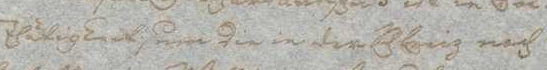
Thätigkeit, um die in der Schweiz noch
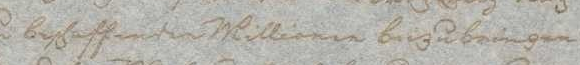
zu beschaffenden Millionen beizubringen.
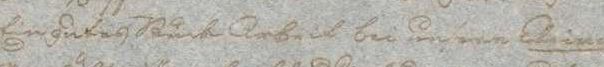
Ein gutes Stück Arbeit bei unsern kleinen
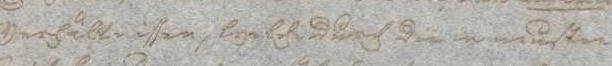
Verhältnissen, welche durch die in neuster
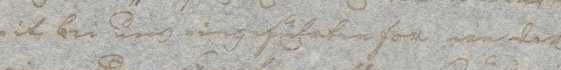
Zeit bei uns eingeführten Formen der
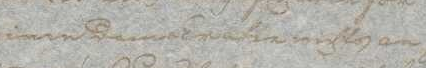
reinen Demokratie nichts an
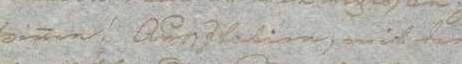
winnen! Aus Italien, mit dem ich in
